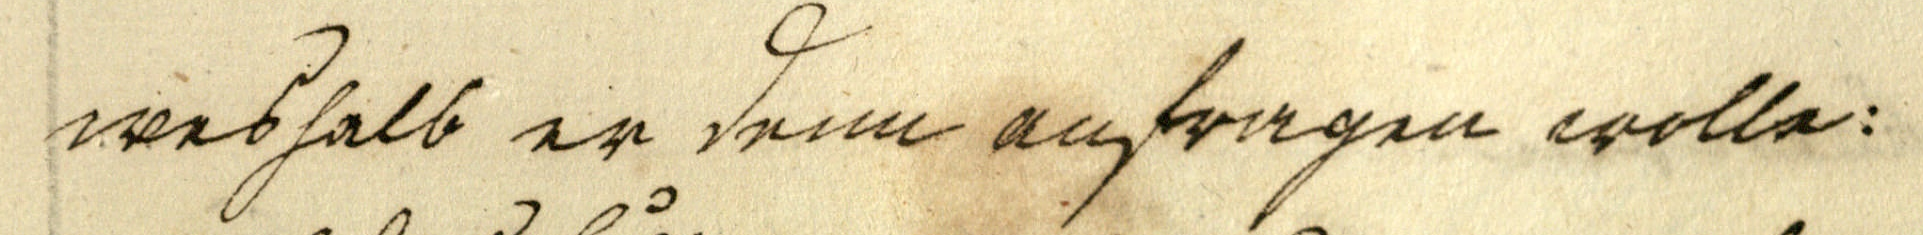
weshalb er denn anfragen wolle:
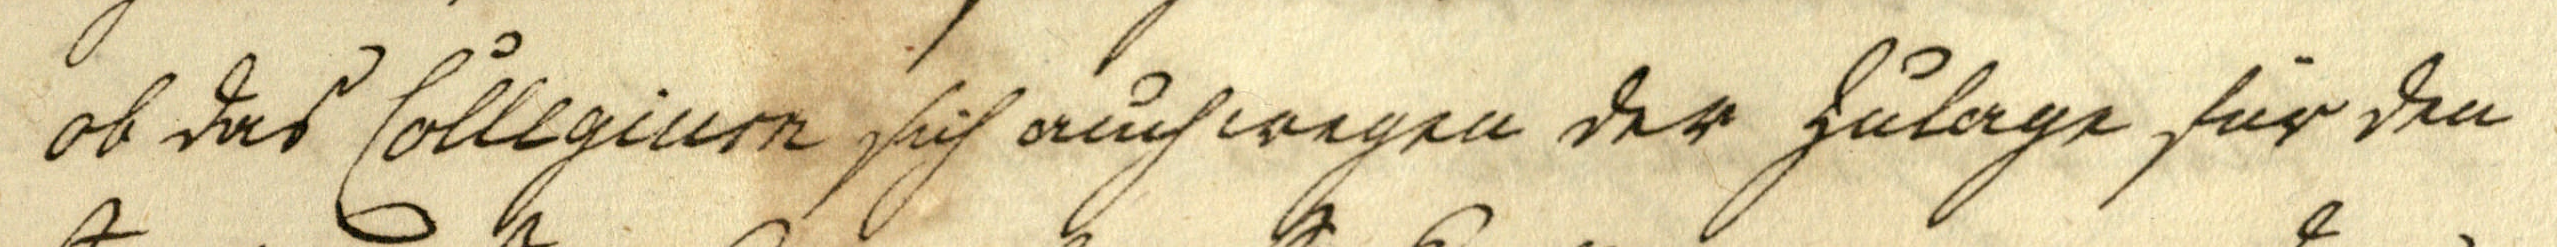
ob das Collegium sich auch wegen der Zulage für den
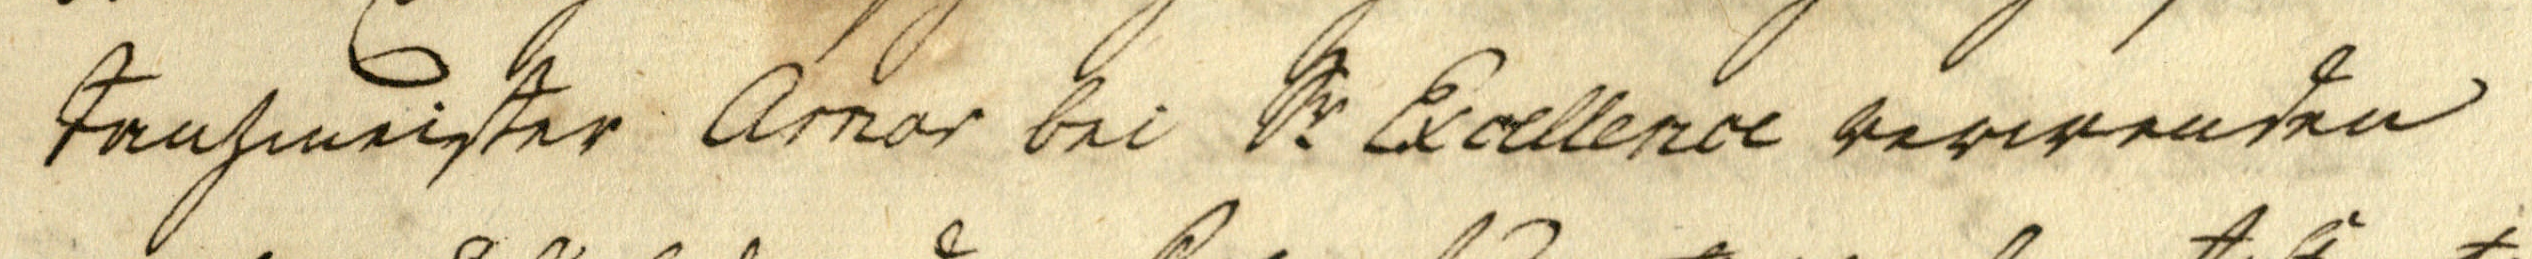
Tanzmeister Amor bei Sr. Excellence verwenden
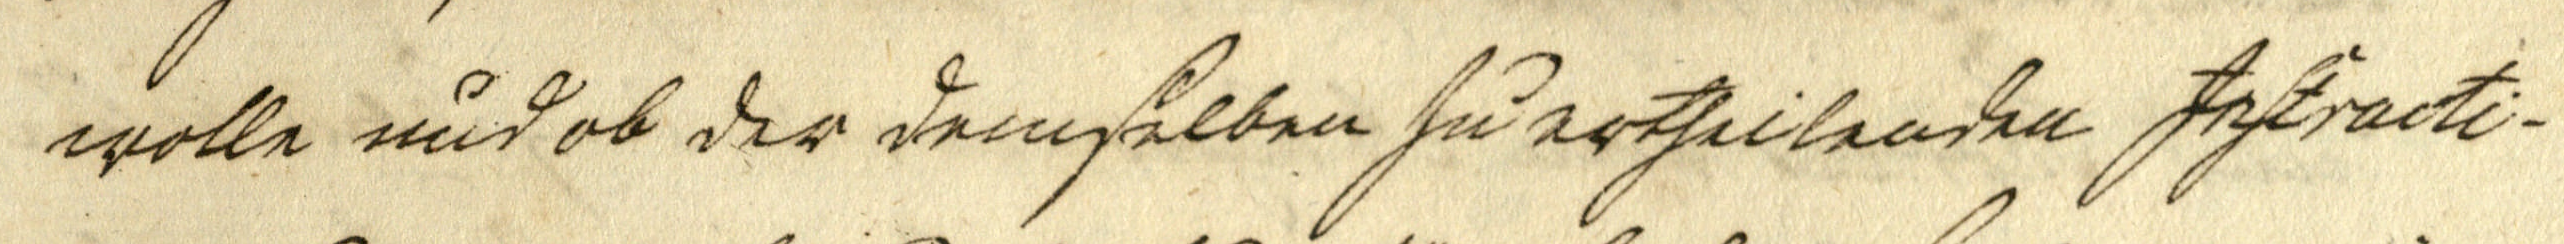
wolle und ob der demselben zu ertheilenden Instructi-
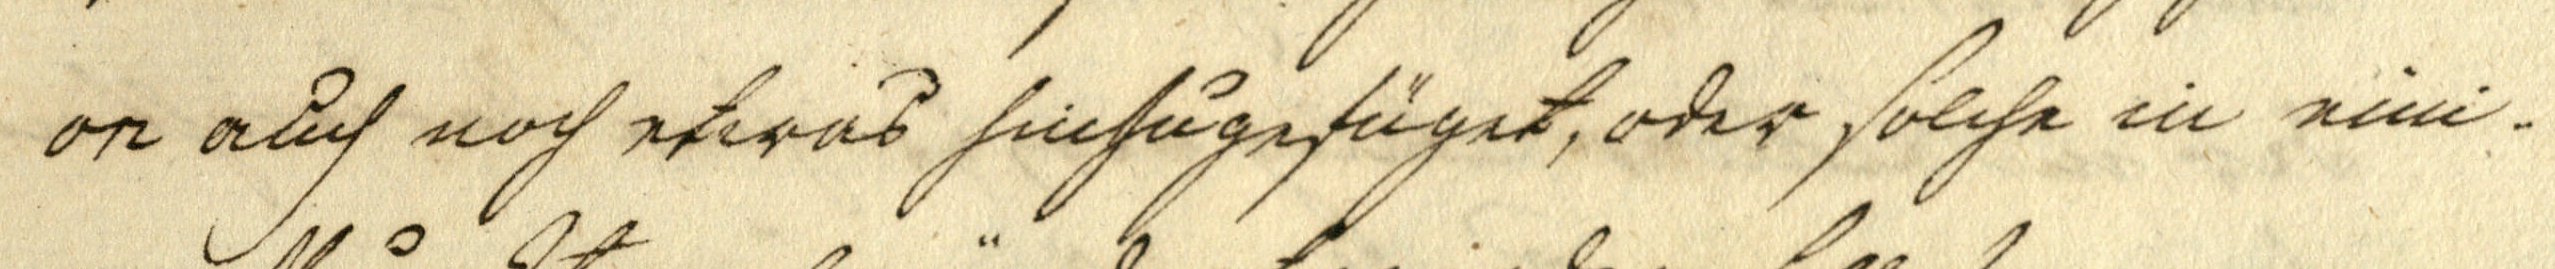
on auch noch etwas hinzugefüget, oder solche in eini-
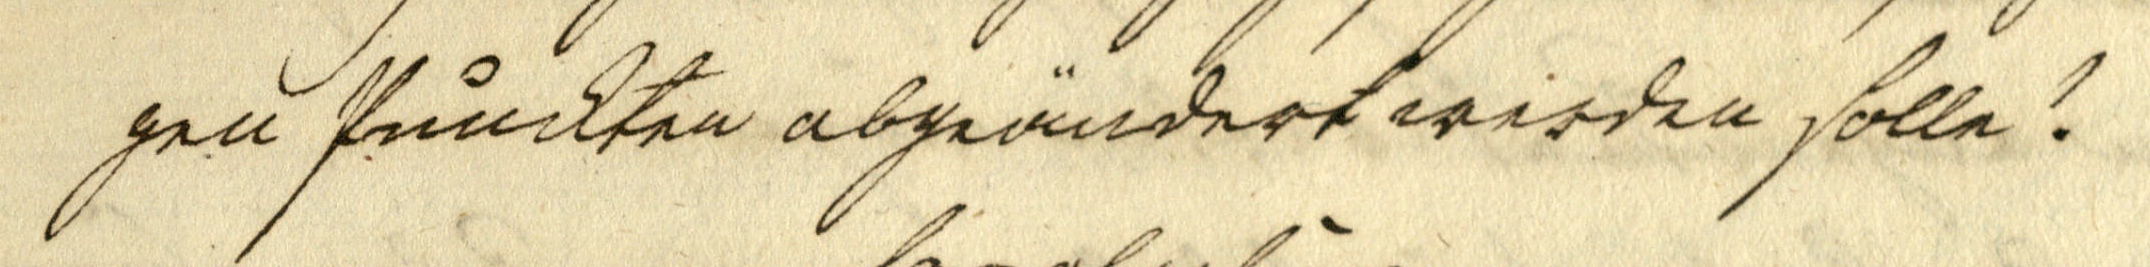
gen Punkten abgeändert werden solle?
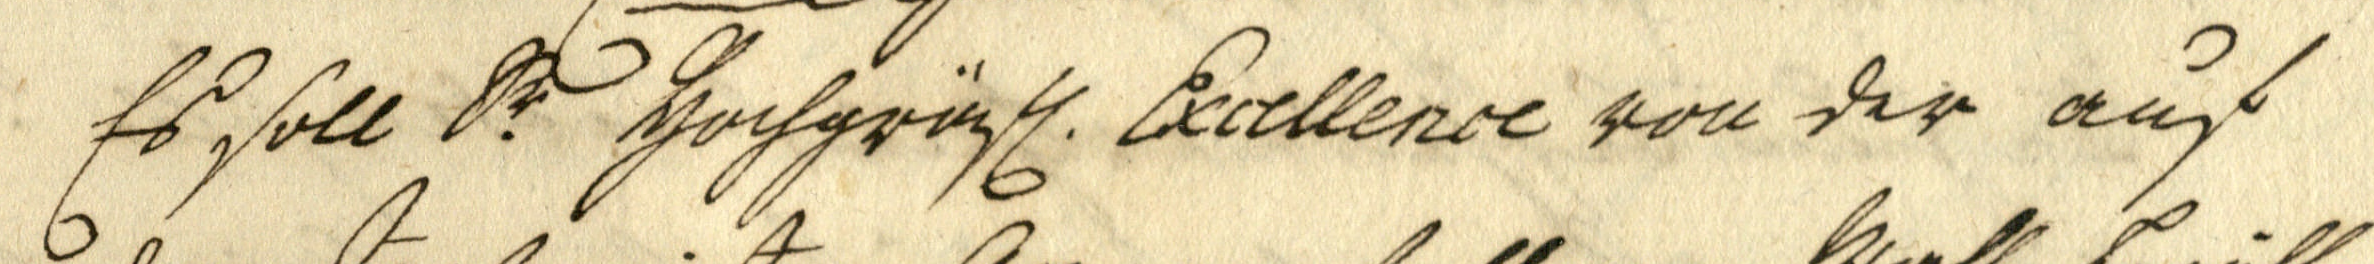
Es soll Sr. Hochgräf. Excellence von der auf
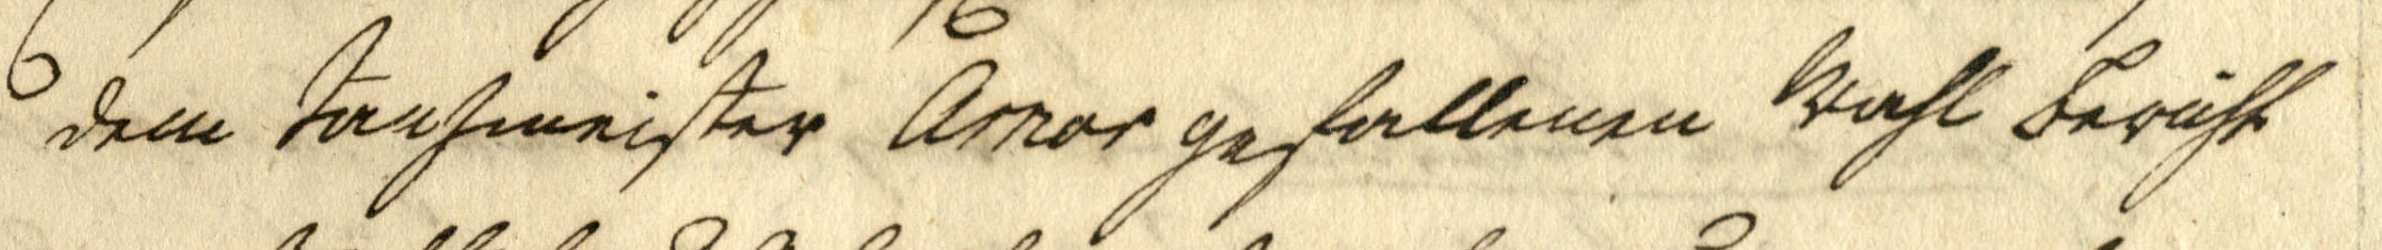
dem Tanzmeister Amor gefallenen Wahl Bericht
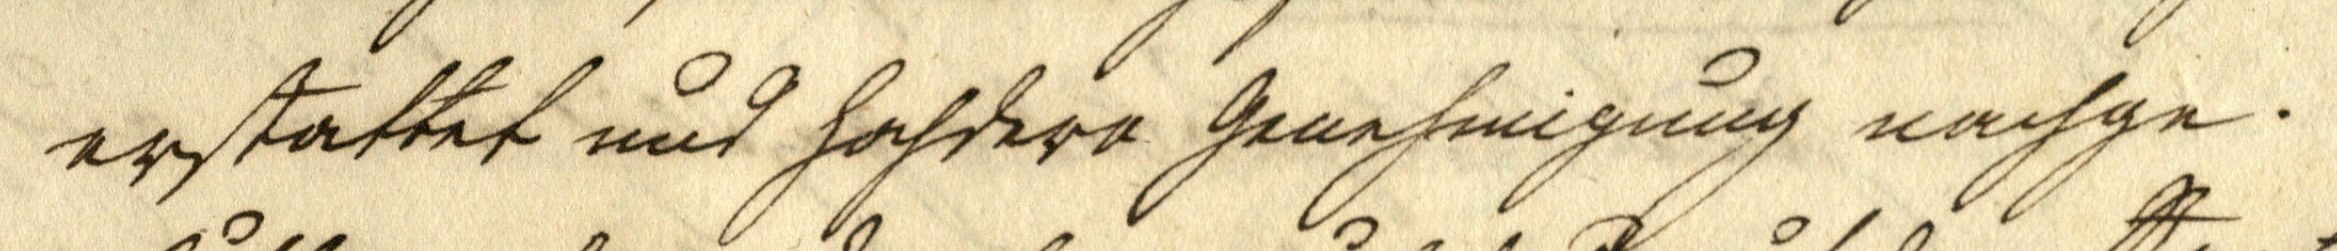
erstattet und hochdero Genehmigung nachge-
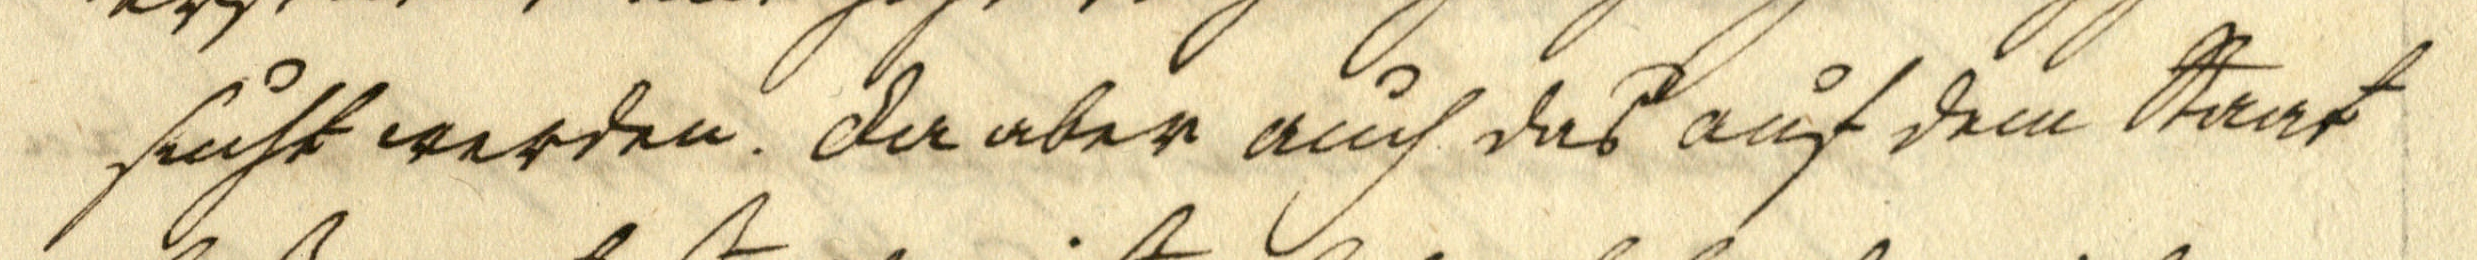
sucht werden. Da aber auch das auf dem Staat
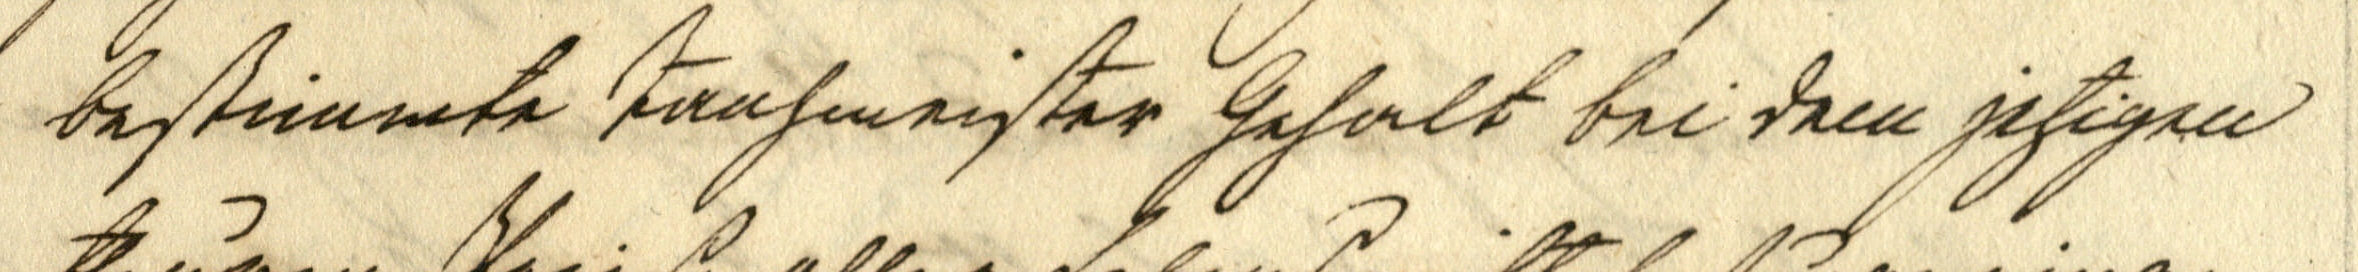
bestimmte Tanzmeister Gehalt bei dem jetzigen
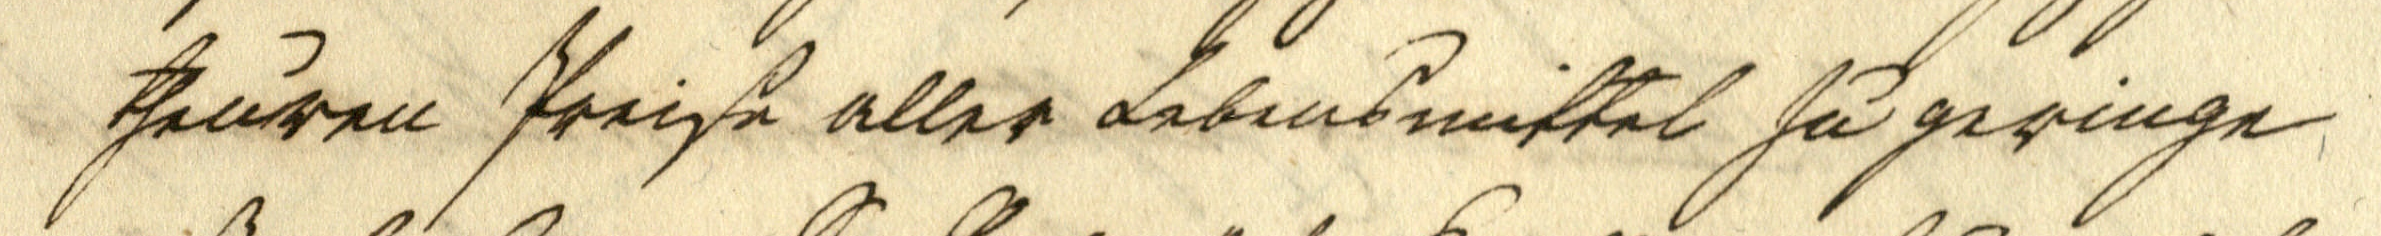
theuren Preise aller lebensmittel zu geringe
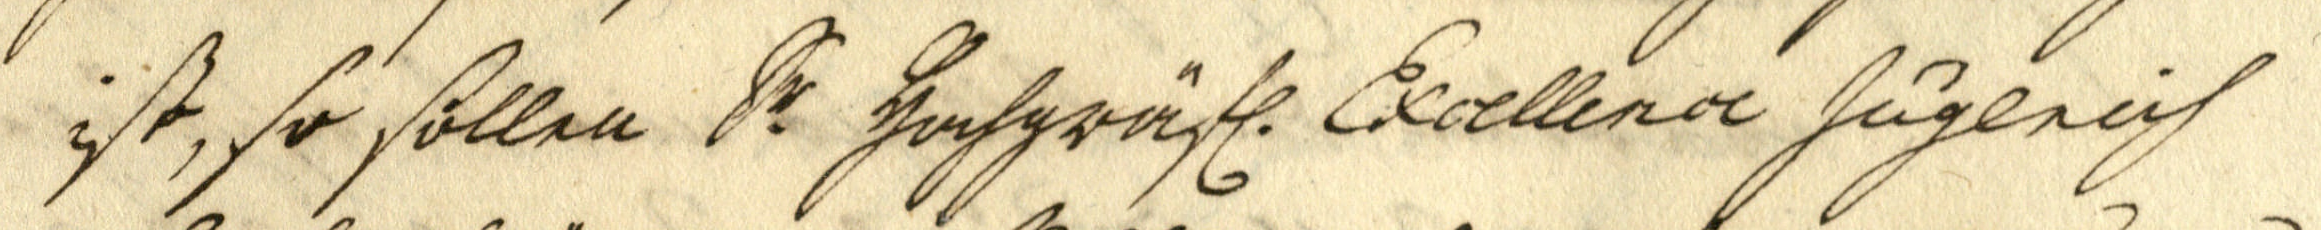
ist, so sollen Sr. Hochgräf. Excellence zugleich
